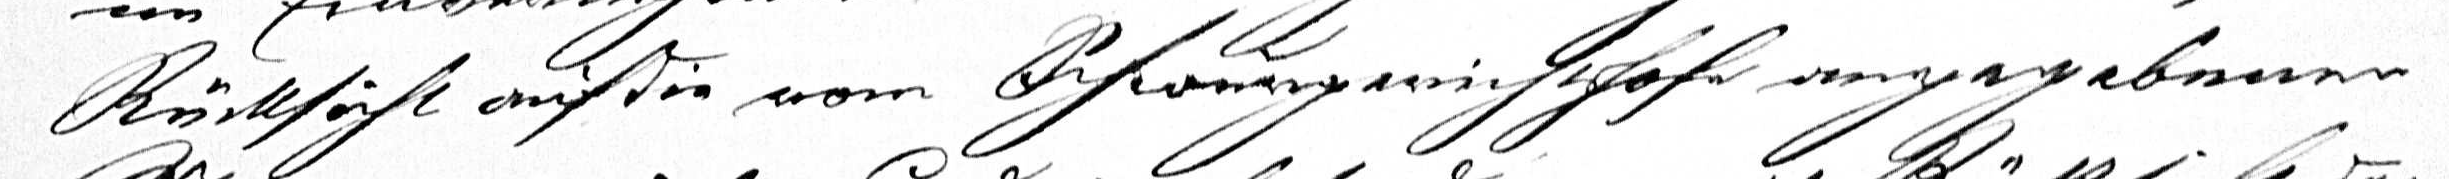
Rücksicht auf die vom Schwugerichtshofe angegebenen
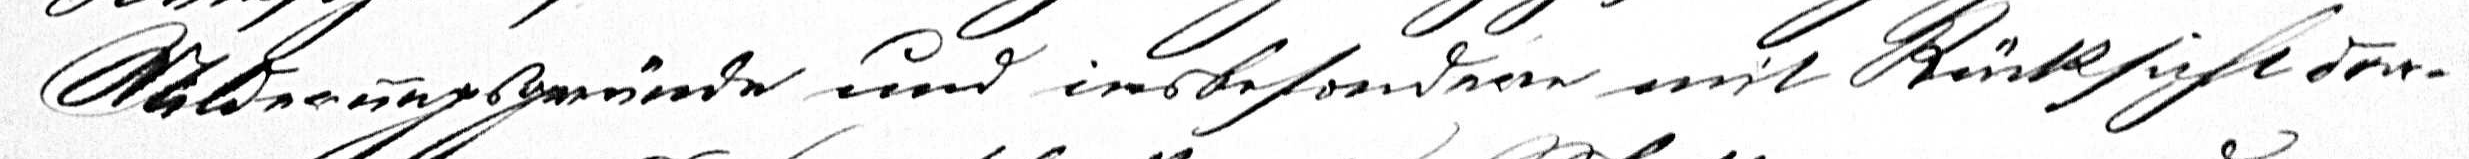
Milderungsgründe und insbesondere mit Rücksicht dar¬
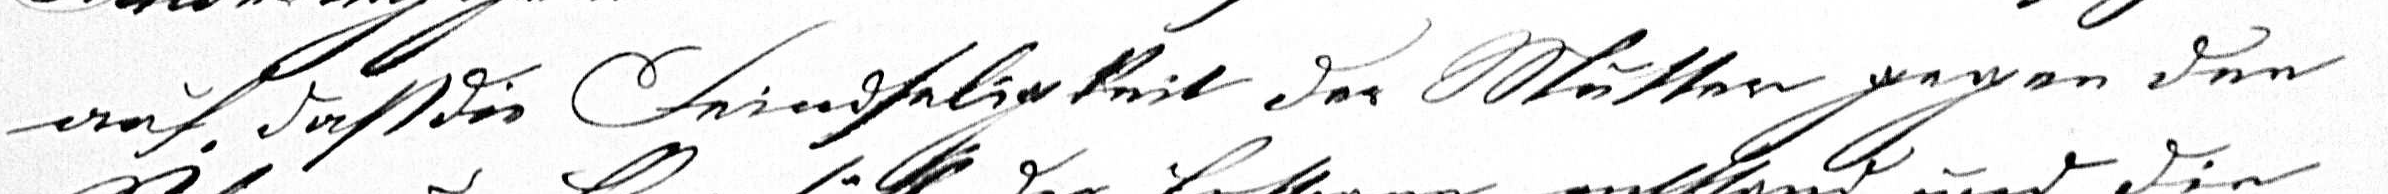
auf, daß die Feindseligkeit der Mutter gegen den
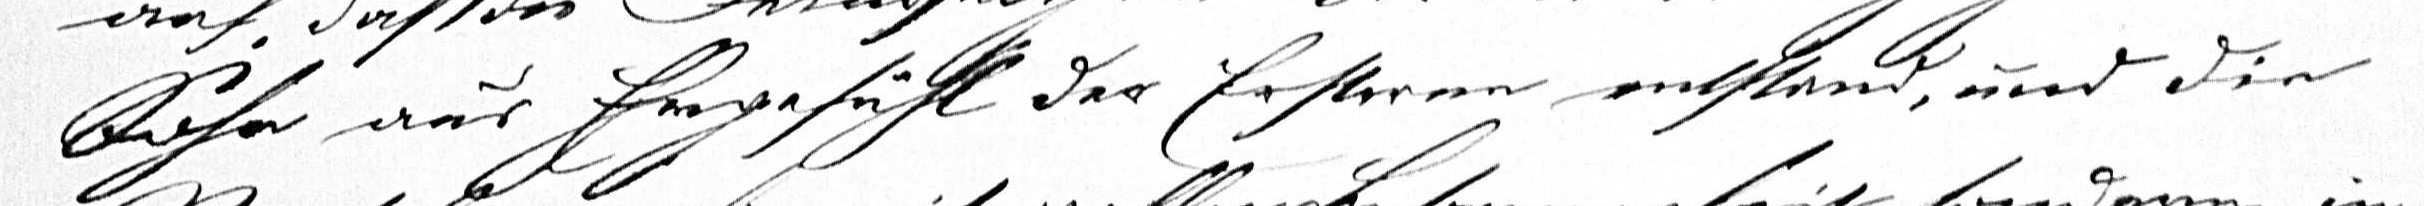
Sohn aus Ehrgefühl der Ersteren entstand, und die
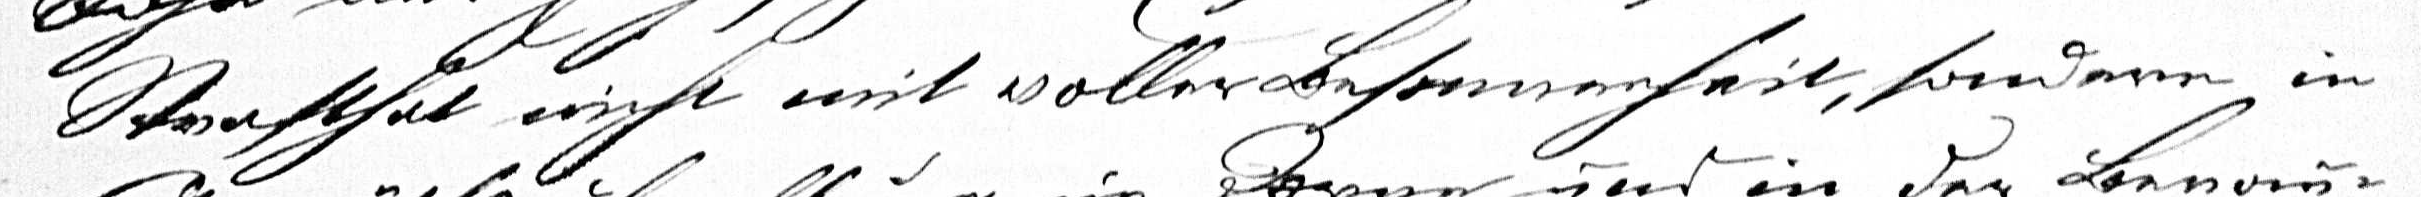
Strafthat nicht mit voller Besonnenheit, sondern in
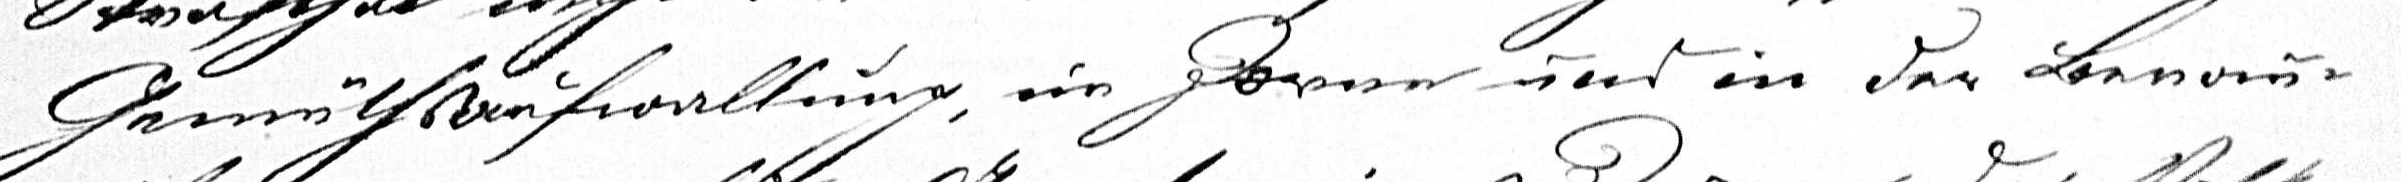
Gemüthsaufwaltung, im Zorne und in der Berau¬
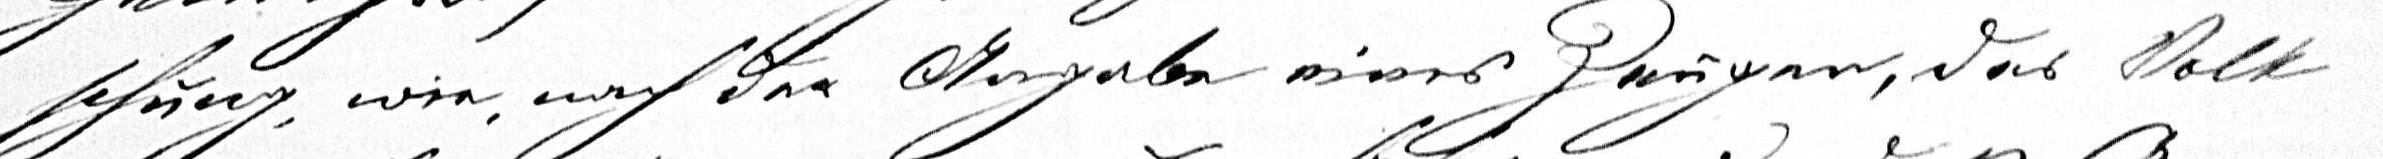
schung , wie, nach der Angabe eines Zeugen, das Volk
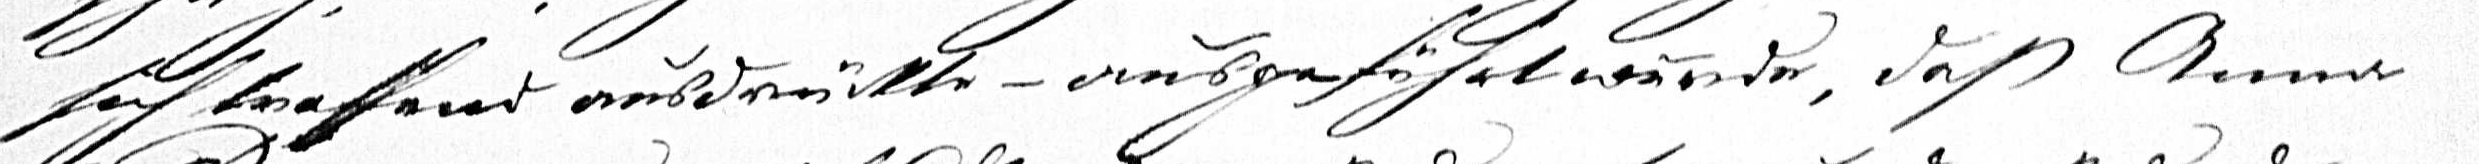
sich treffend ausdrückte – ausgeführt wurde, daß Anna
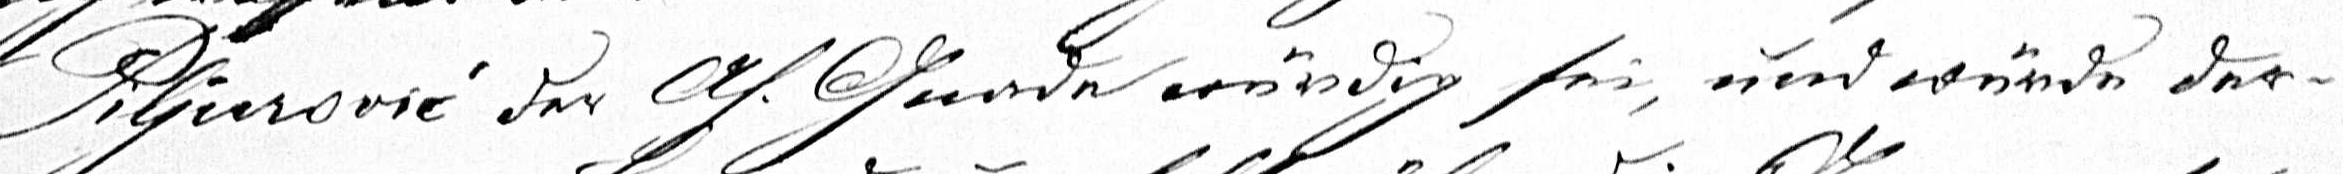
Piljurović der Ah Gnade würdig sei, und würde der¬
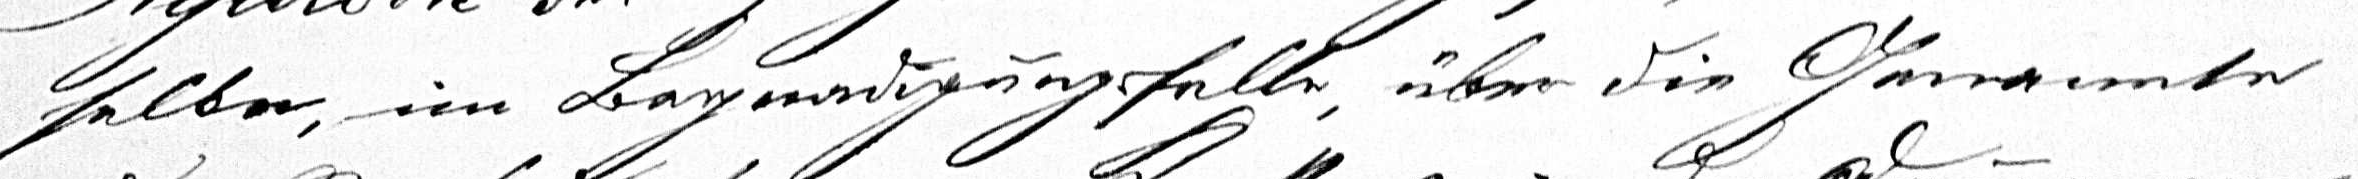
selbe, im Begnadigungsfalle, über die Genannte
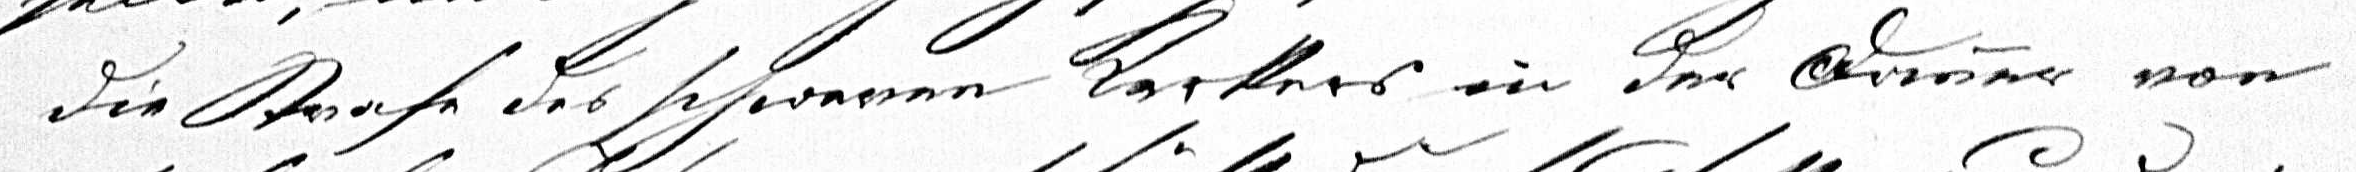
die Strafe des schweren Kerkers in der Dauer von
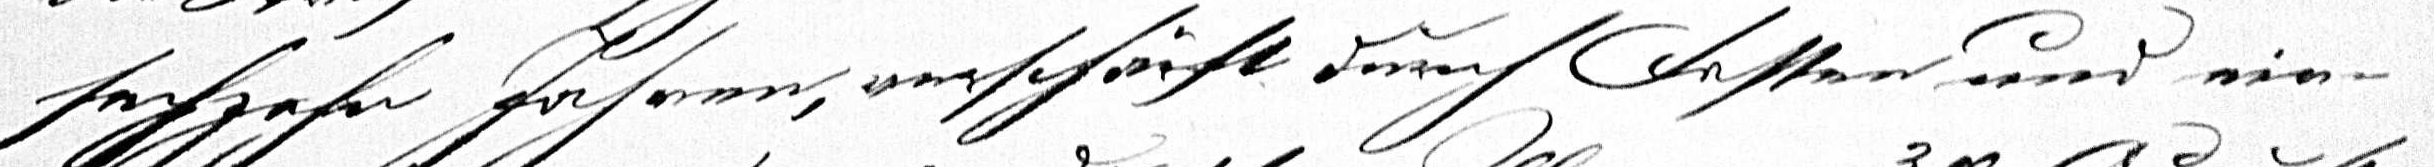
sechzehn Jahren, verschärft durch Fasten und ein¬
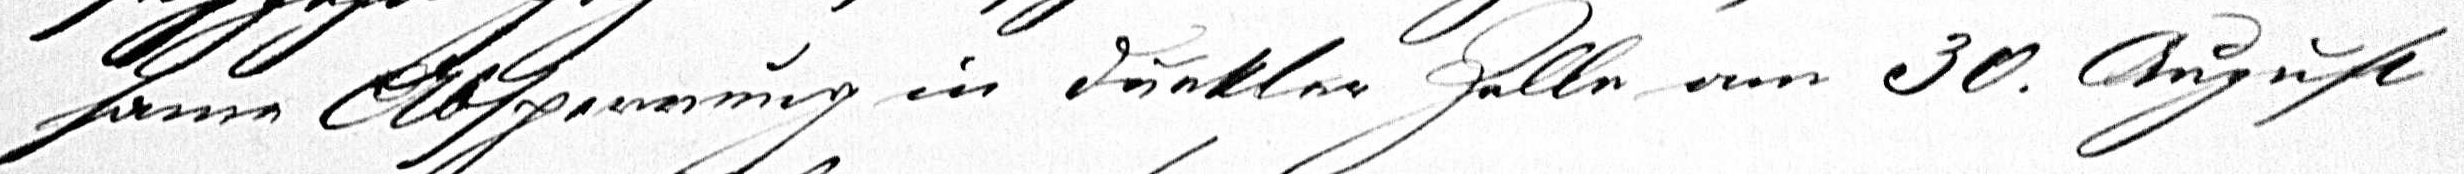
same Absperrung in dunkler Zelle am 30. August
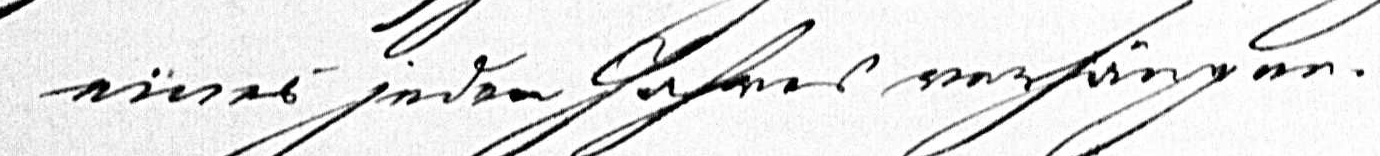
eines jeden Jahres verhängen.
